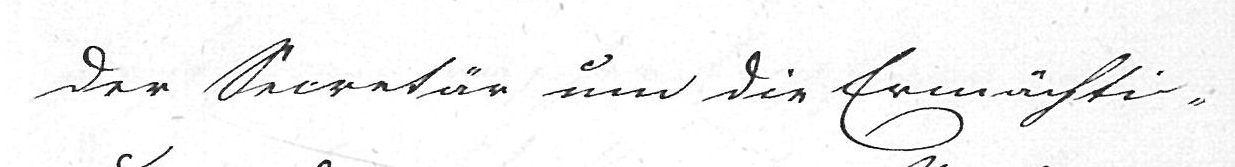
der Secretär um die Ermächti-
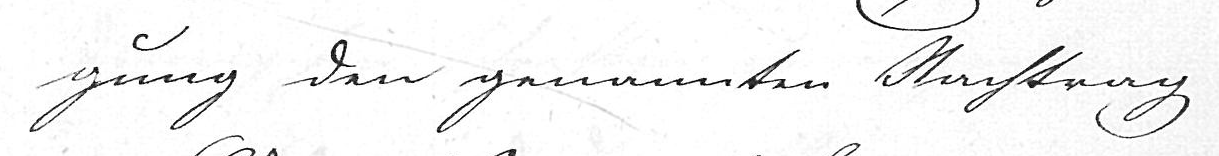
gung den genannten Nachtrag
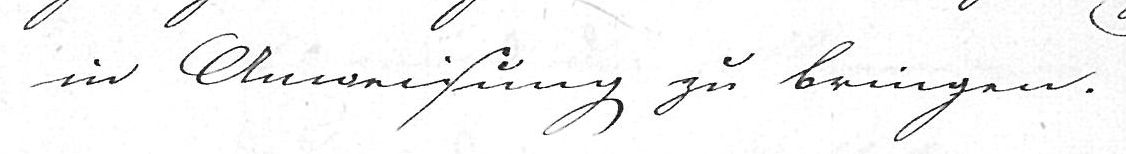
im Anweisung zu bringen.
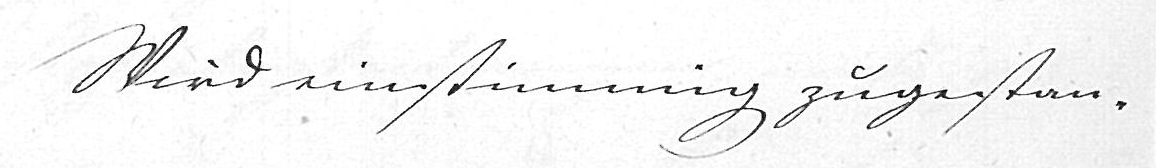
Wird einstimmig zugestan-
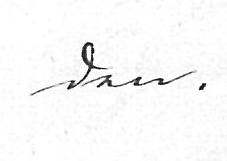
den.
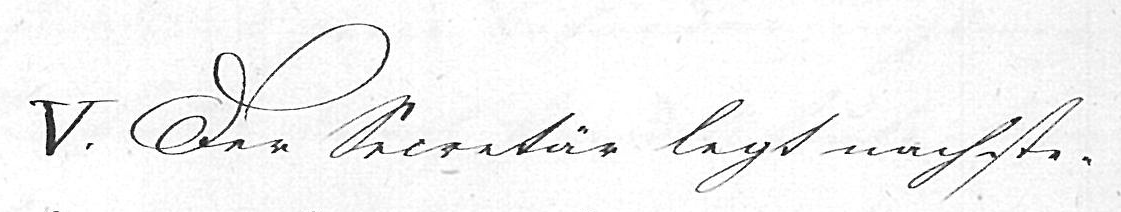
V. Der Secretär liegt nachste-
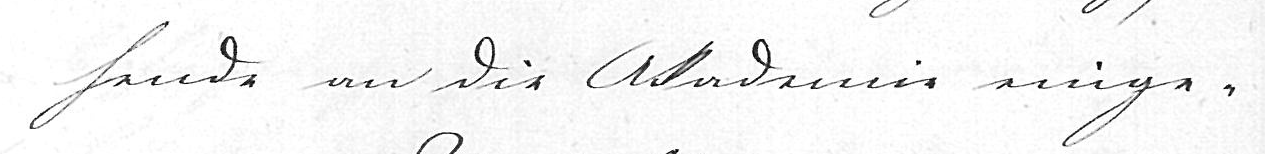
hende an die Akademie einige-
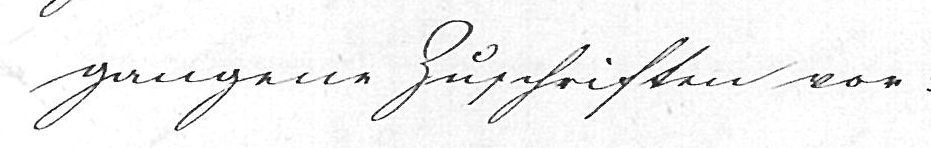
gangene Zuschriften vor:
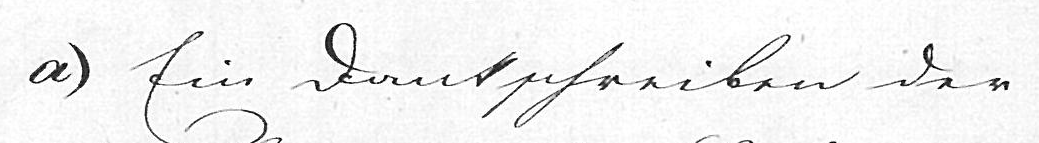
a) Ein Dankschreiben der
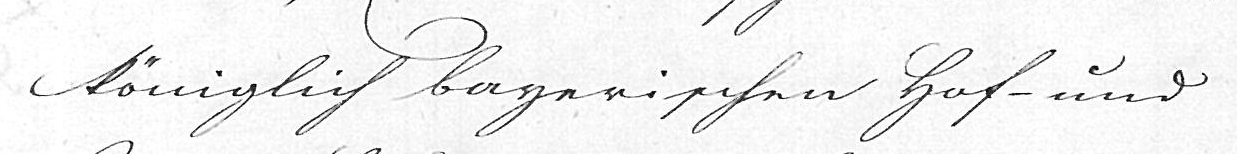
königlich bayerischen Hof- und
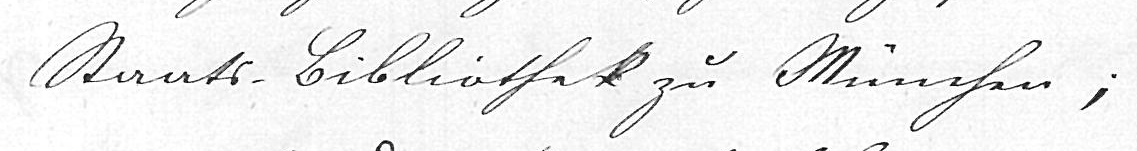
Staats-Bibliothek zu München;
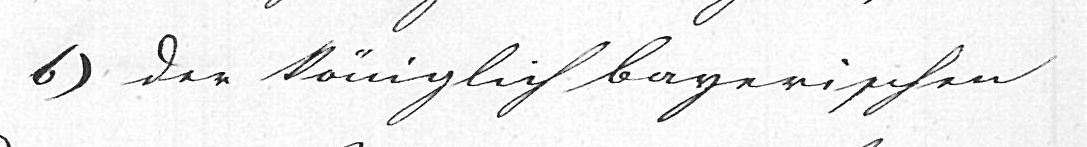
b) der königlich bayerischen
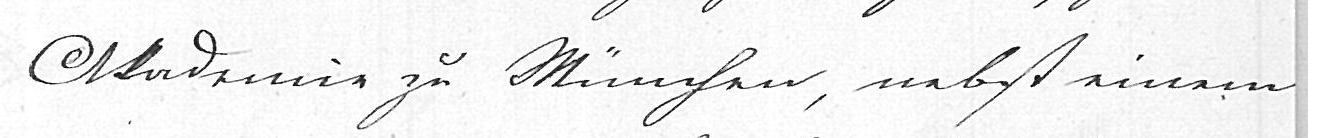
Akademie zu München, nebst einem
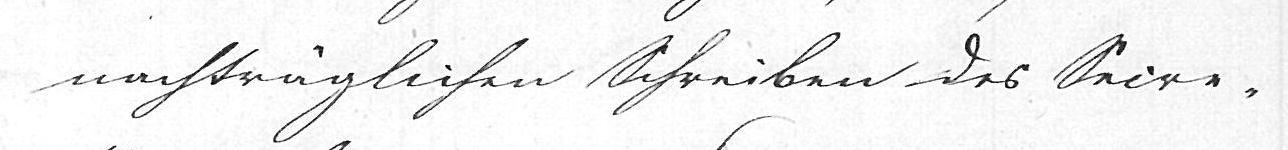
nachträglichen Schreiben des Secre-
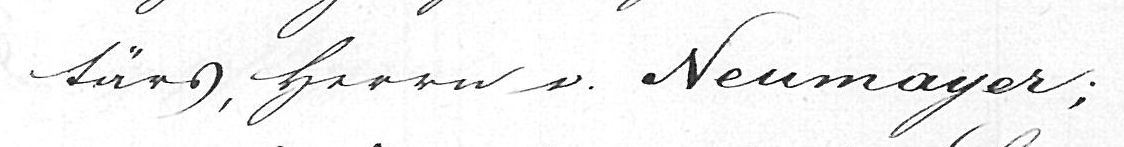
tärs, Herrn v. Neumayer;
